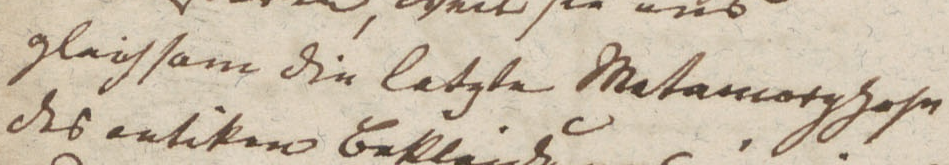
gleichsam die letzte Metamorphose
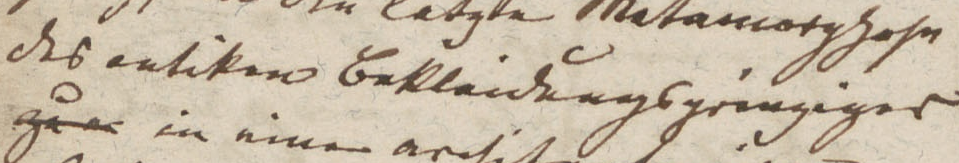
des antiken Bekleidungsprinzipes
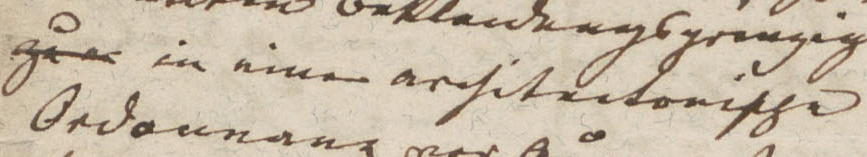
zu in eine architectonische
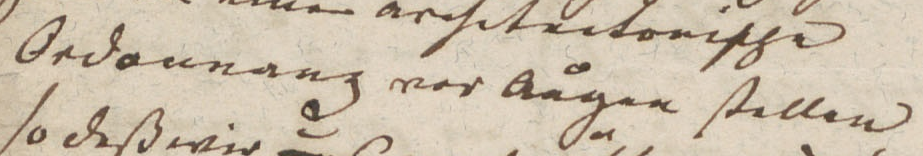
Ordonnanz vor Augen stellen,
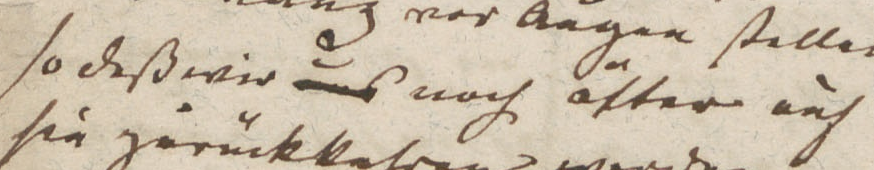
so dass wir uns noch öfter auf
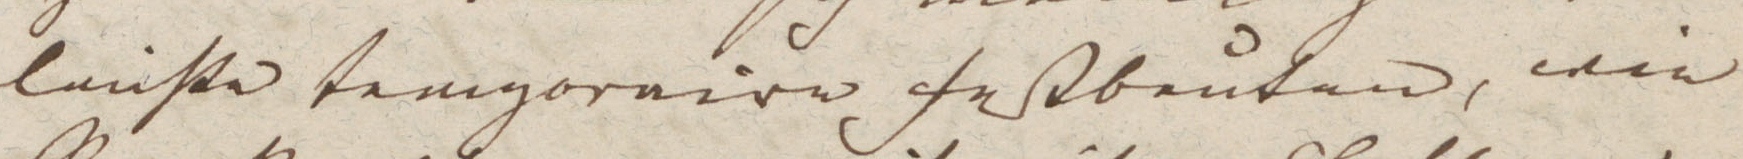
leichte temporaire Festbauten, wie
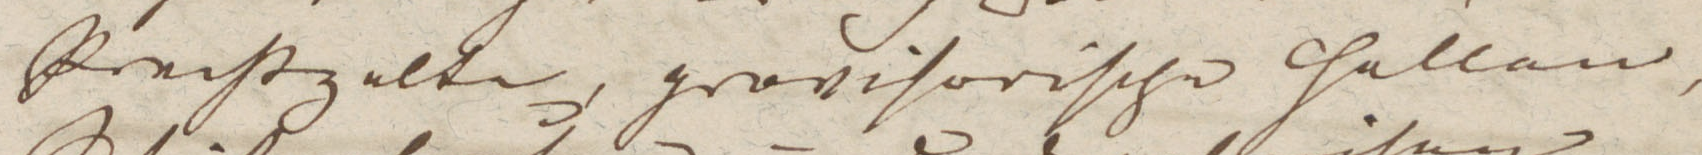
Prachtzelte, provisorische Hallen,
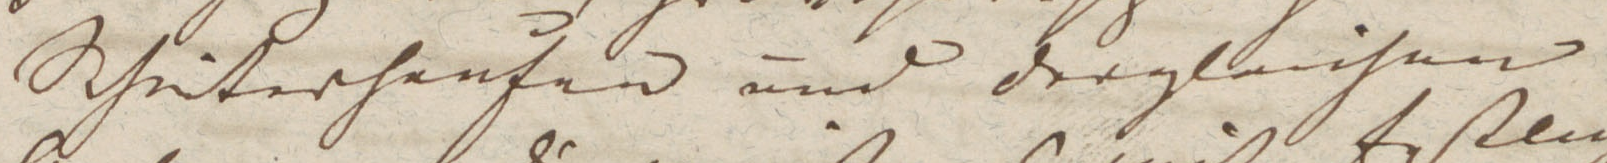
Scheiterhaufen und dergleichen
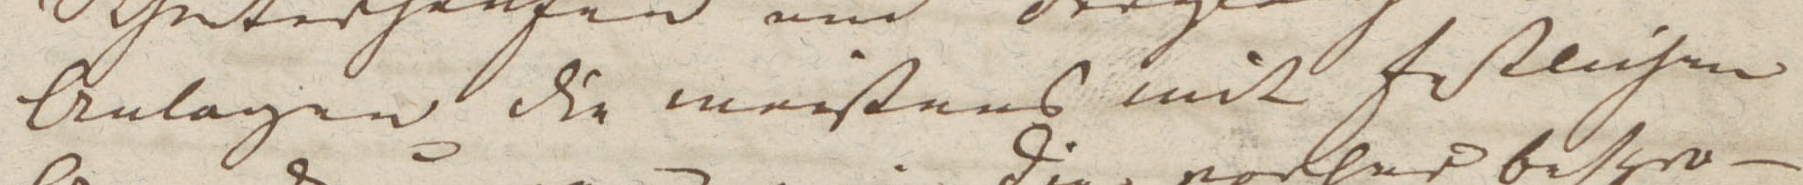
Anlagen die meistens mit festlichen
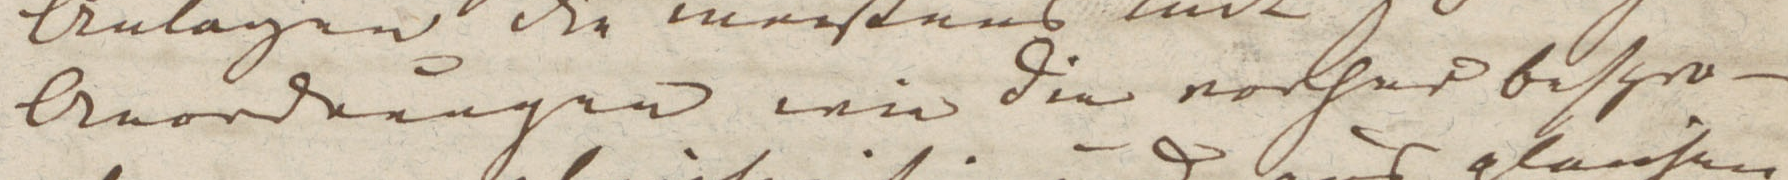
Anordnungen wie die vorher bespro-
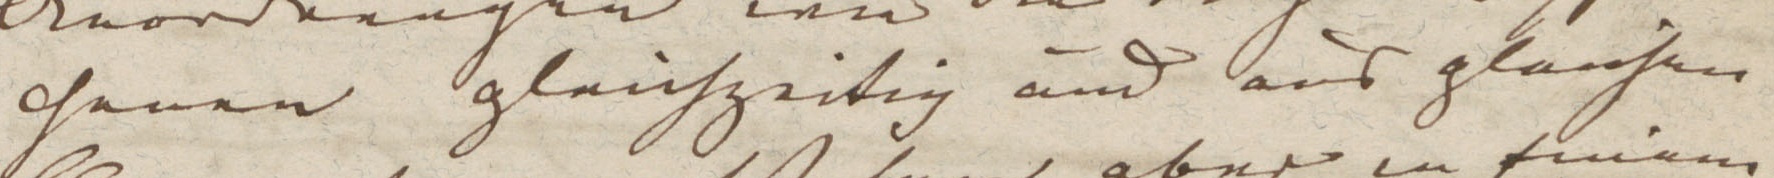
chenen gleichzeitig und aus gleichen
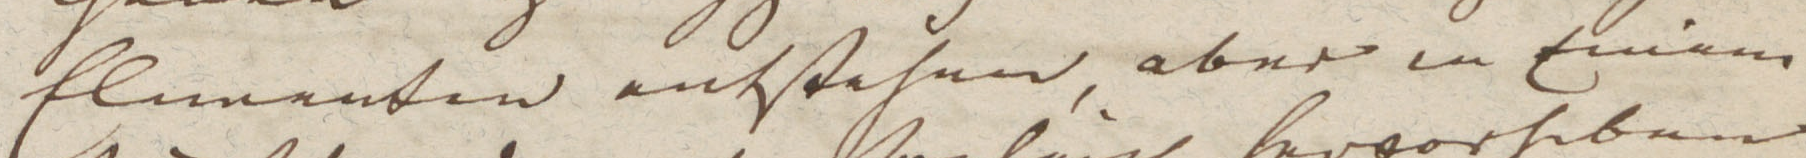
Elementen entstehen, aber in Einem
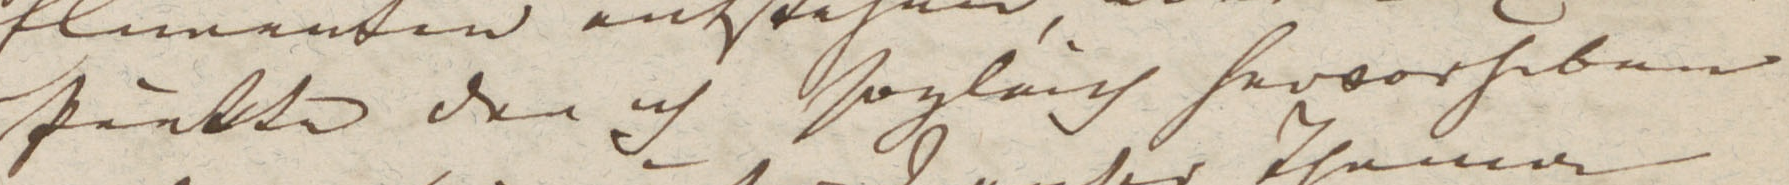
Punkte den ich sogleich hervorheben
